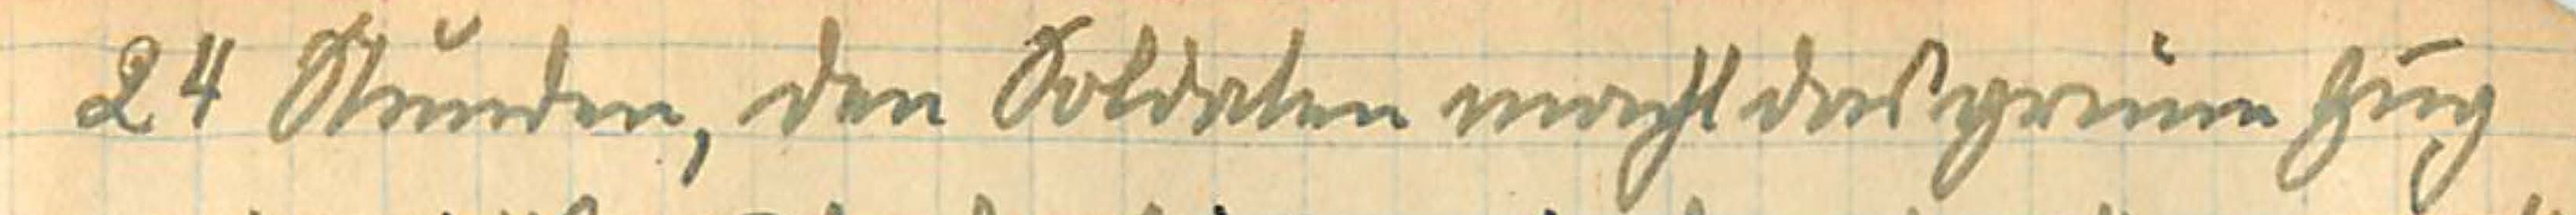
24 Stunden, den Soldaten macht das grüne Zug
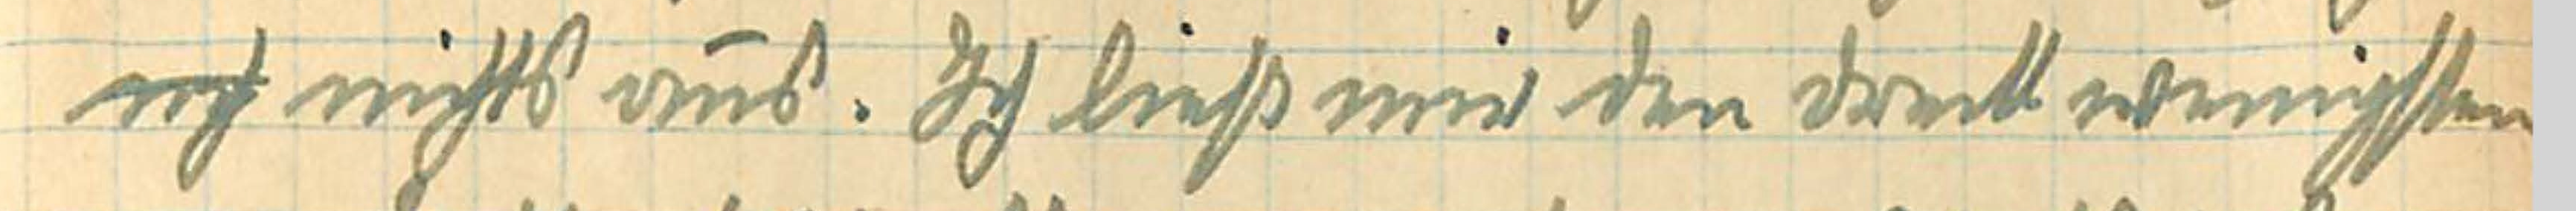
nh nichts aus. Ich ließ mir den Dreck wenigstens
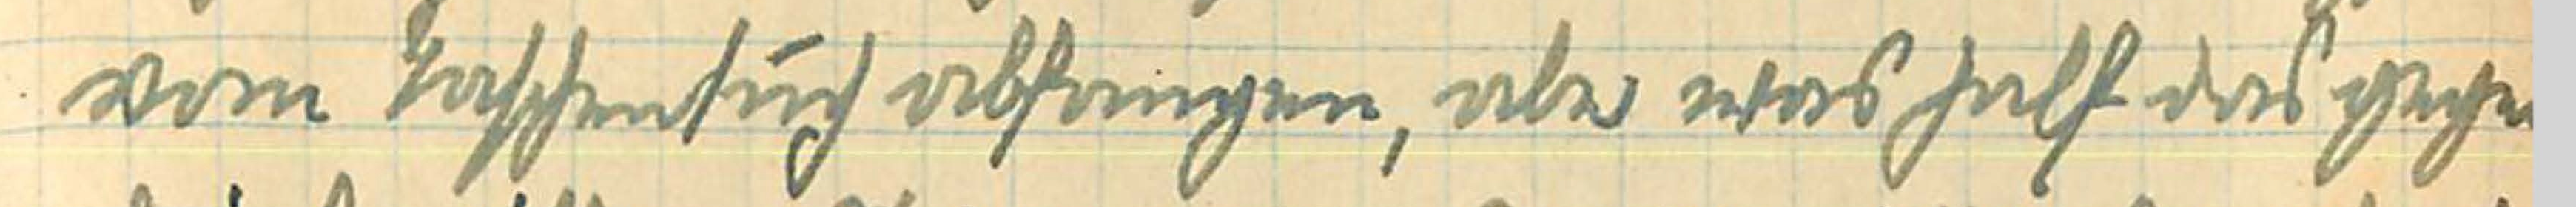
vom Taschentuch abfangen, aber was half das gegen
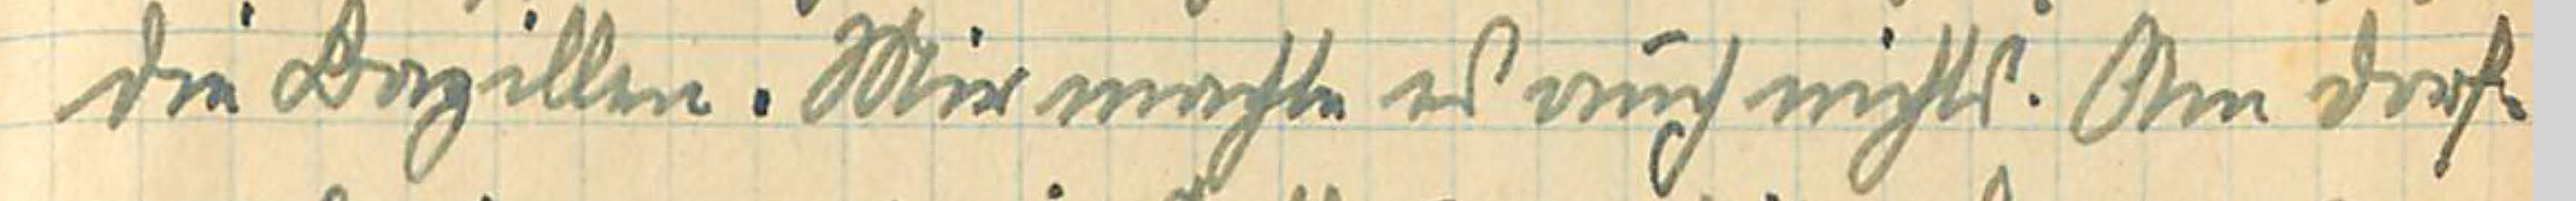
die Bazillen. Mir machte es auch nichts. Am Dorf-
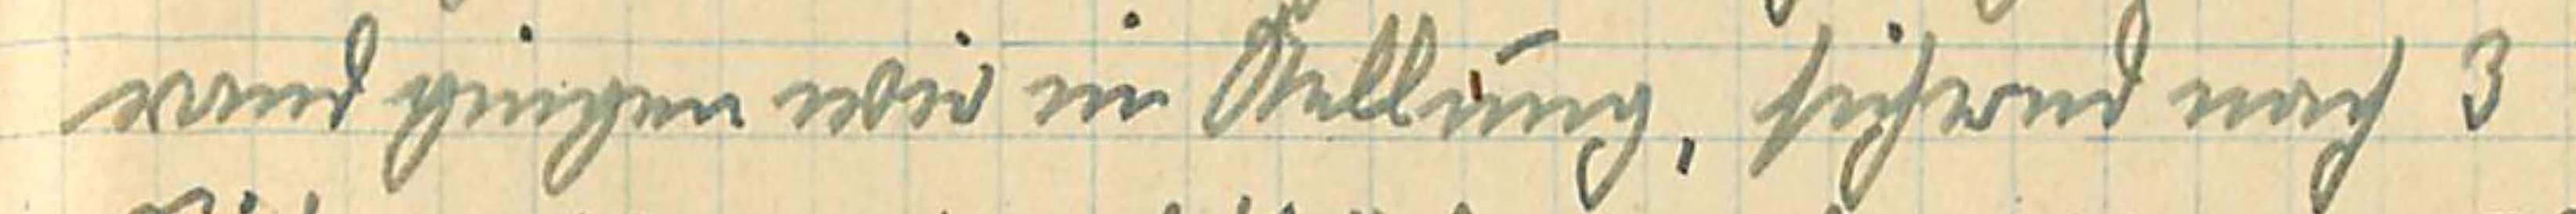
rand gingen wir in Stellung, sichernd nach 3
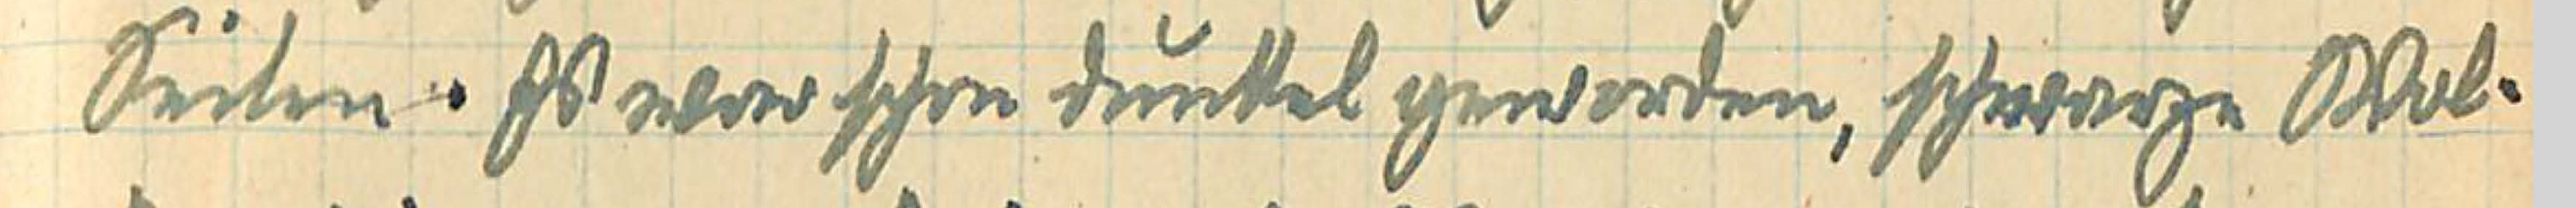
Seiten. Es war schon dunkel geworden, schwarze Wol-
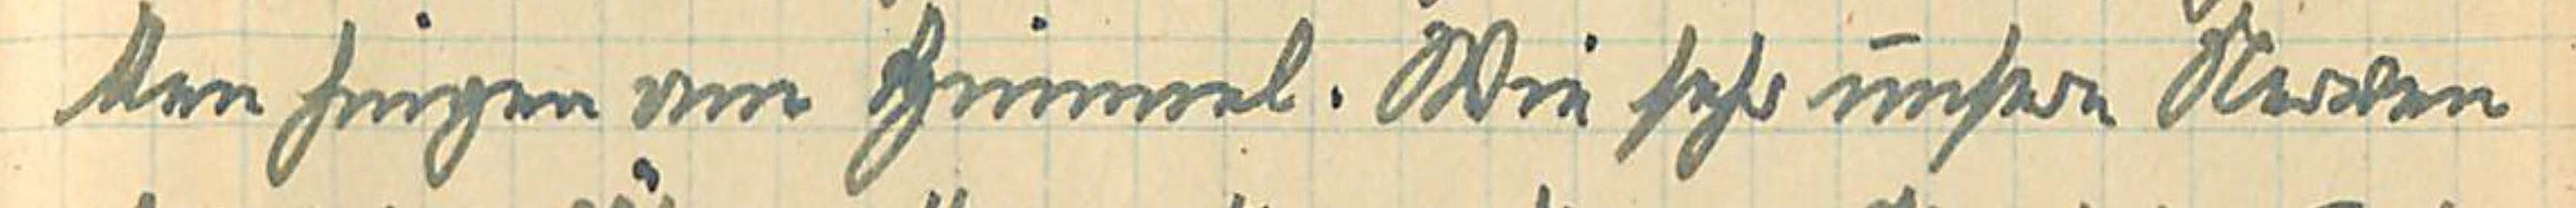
ken hingen am Himmel. Wie sehr unsere Nerven
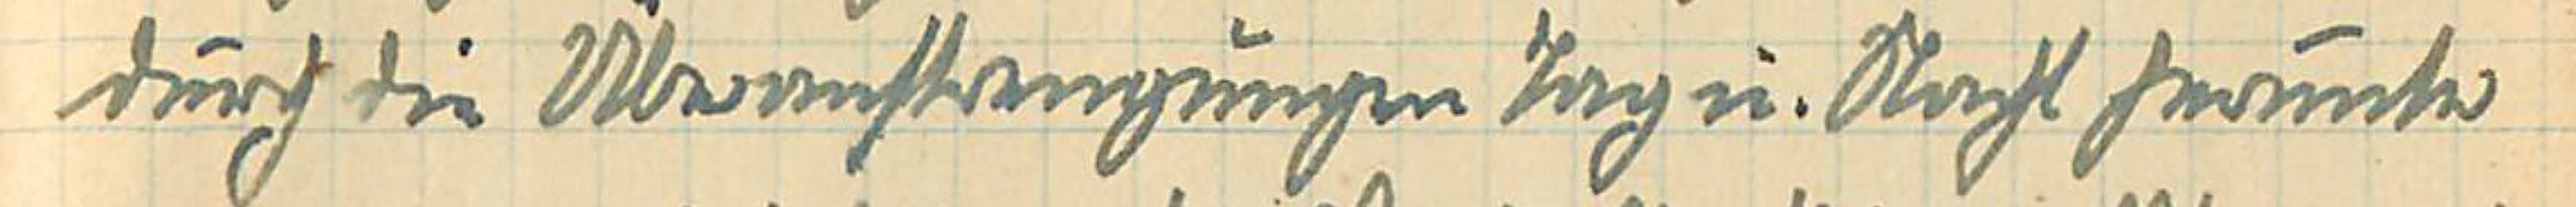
durch die Überanstrengungen Tag u. Nacht herunter
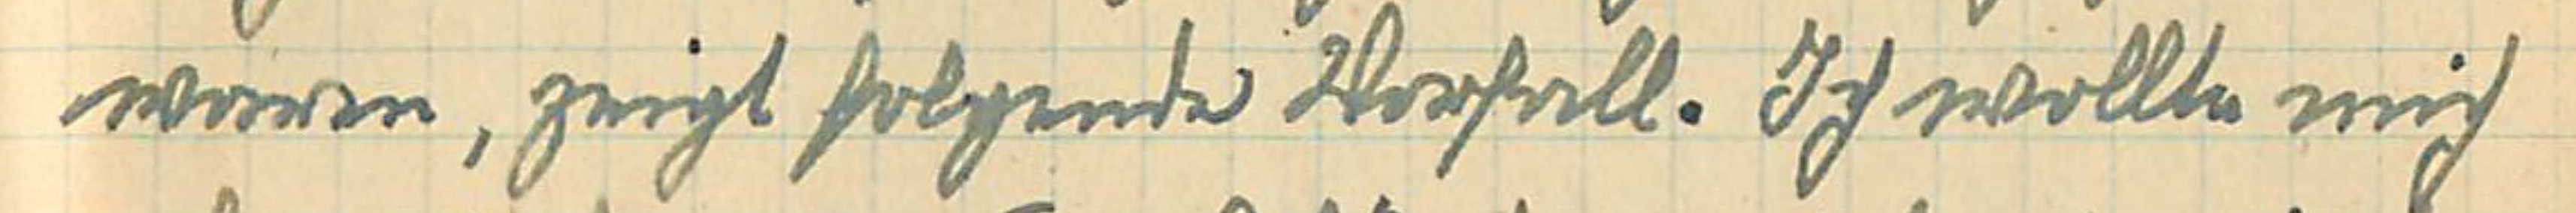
waren, zeigt folgender Vorfall. Ich wollte mich
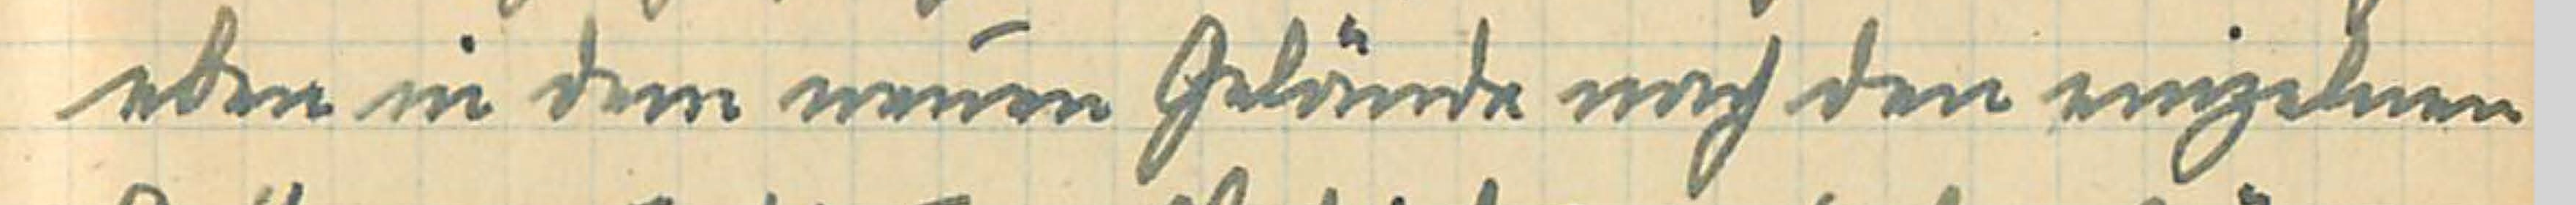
eben in dem neuen Gelände nach den einzelnen
